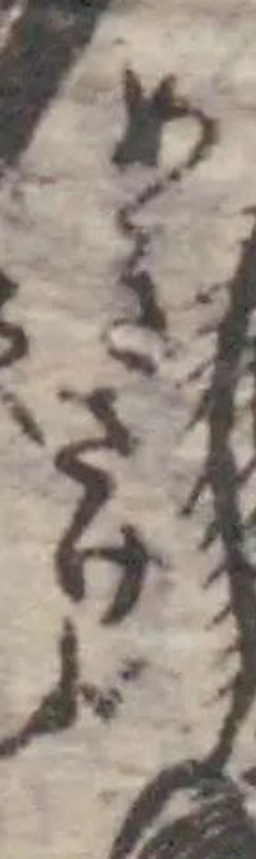めきさけぶ
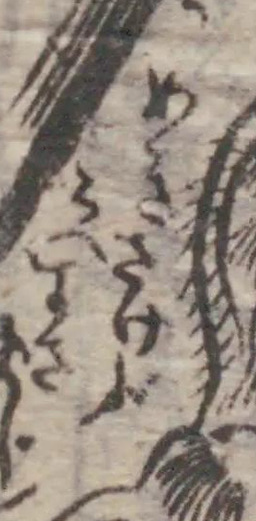めきさけぶ
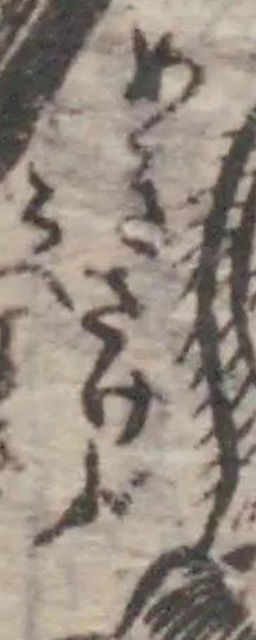めきさけぶ
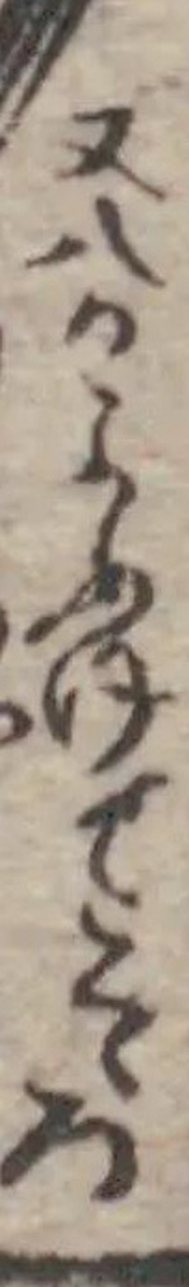又八かよくけてこゝろ
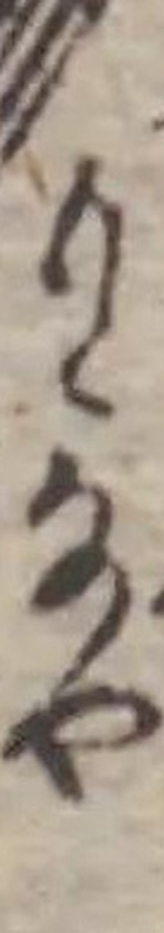もとなや
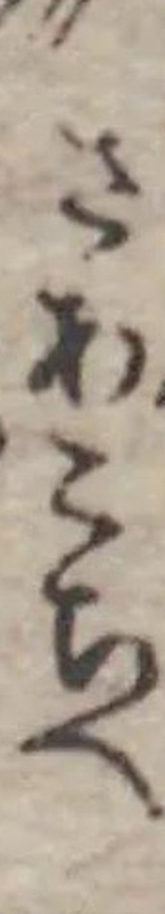さあこちへ
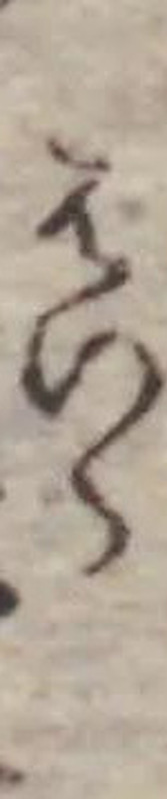はいら
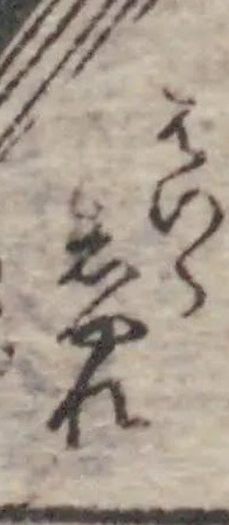しやれ
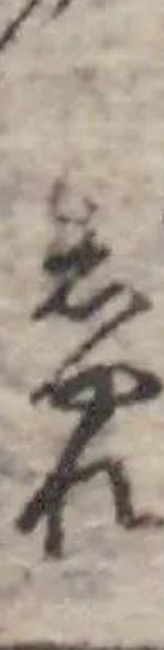しやれ
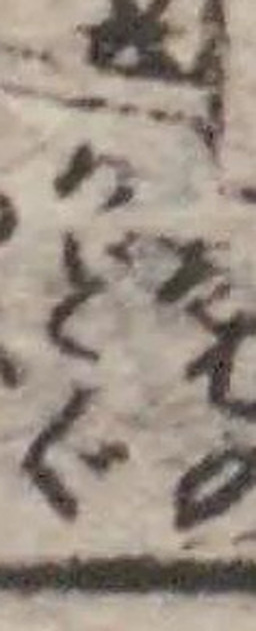かどぐ
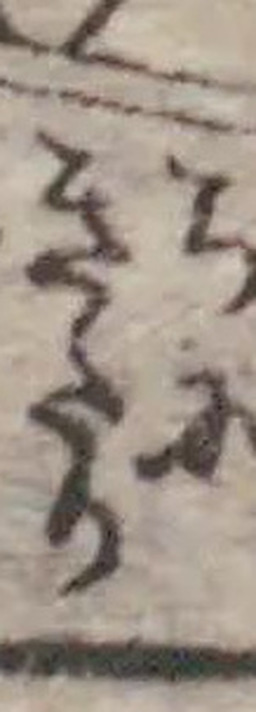きたり
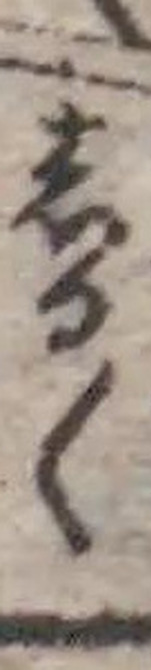しる〳〵
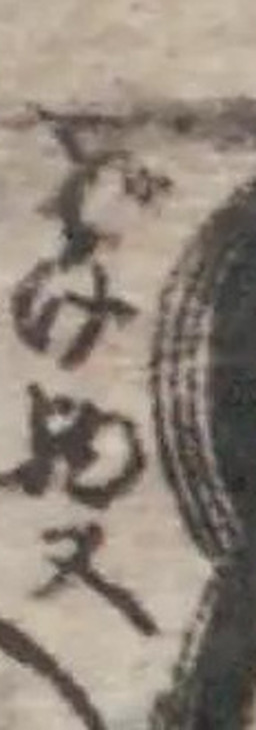ばけ物又
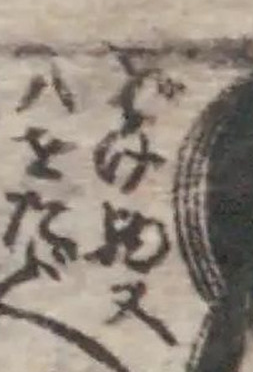ばけ物又
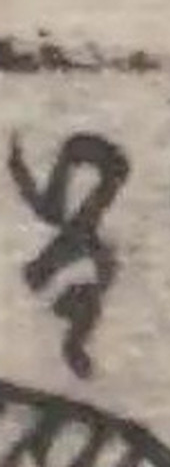いるゝ

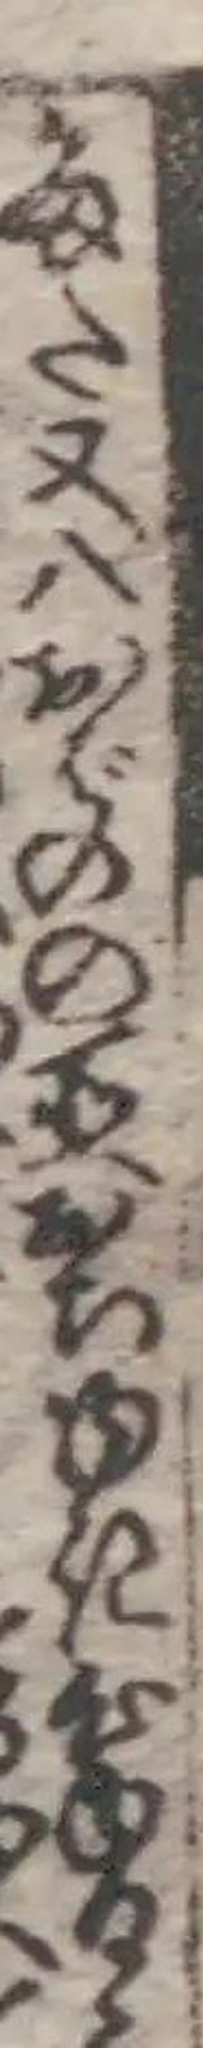かまた又八おばのの所へおちゆき心ゆるみやす
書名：鎌田又八 2巻
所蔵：国立国会図書館 National Diet Library, JAPAN
